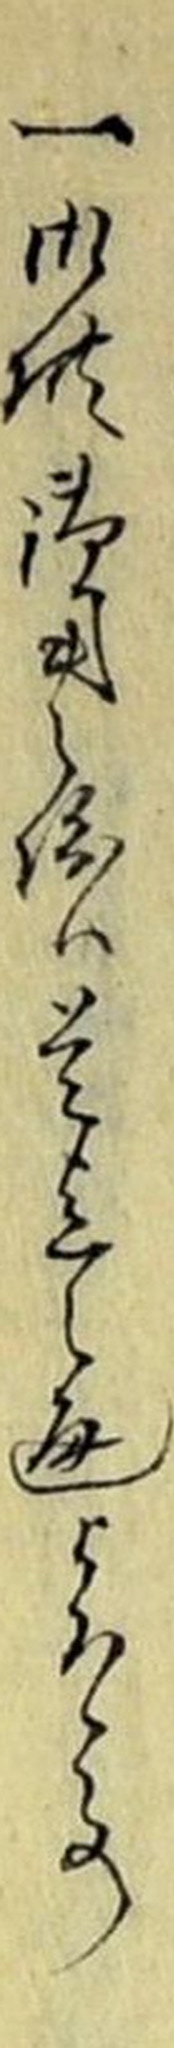一御供御用之儀は是迄之通被下候事
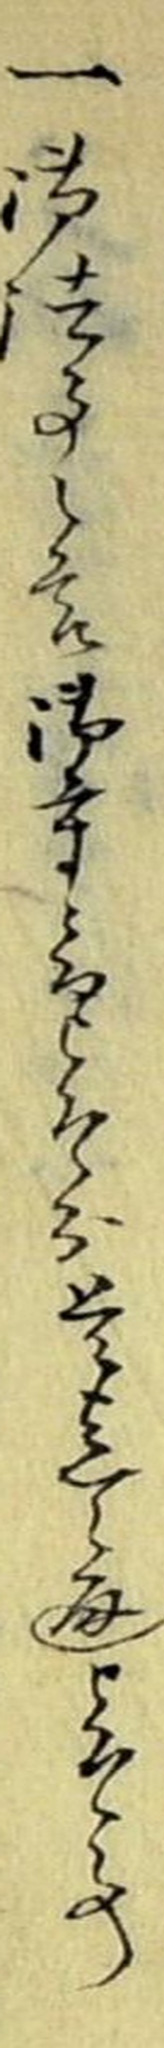一御法事之節御寺に而被下候分是迄之通被下候事
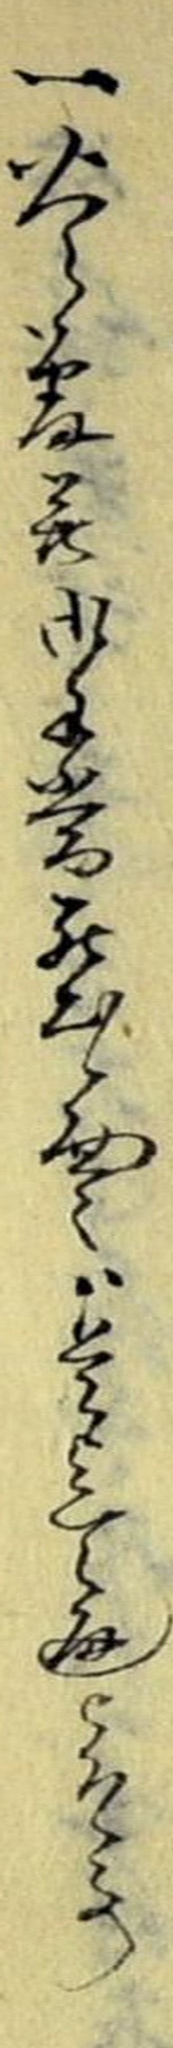一火之番并御手当罷出候面々は是迄之通被下候事

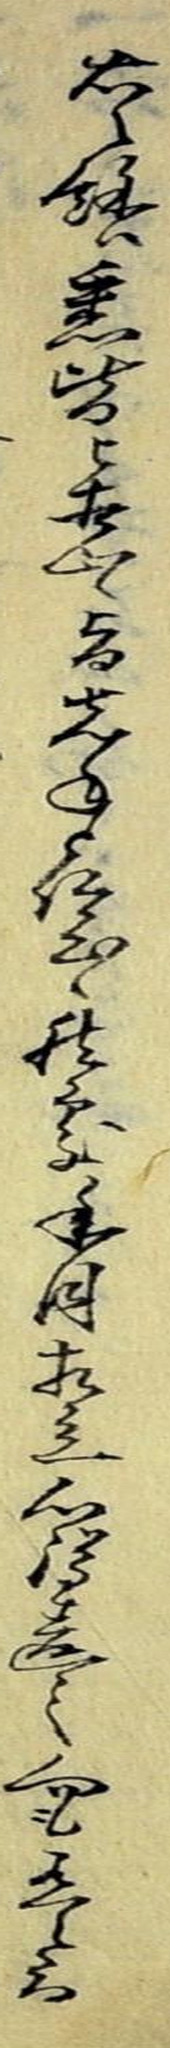右之餘は悉皆被相止候旨先年被仰出候然処年月相立心得違之向も有之候旨
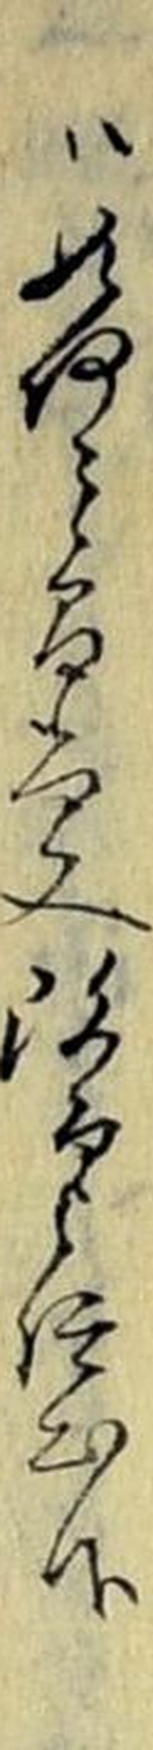は如何に候間尚又改而被仰出候
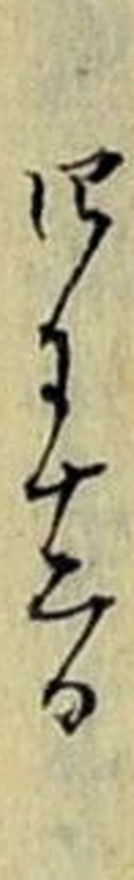四月十二日
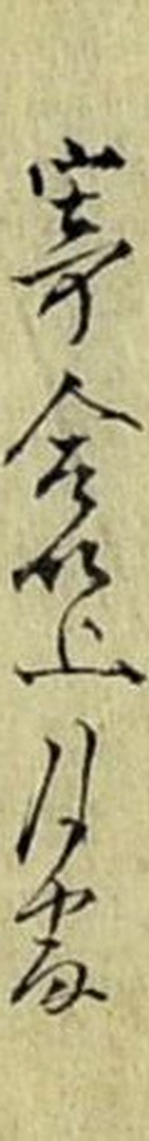寄合以上月番
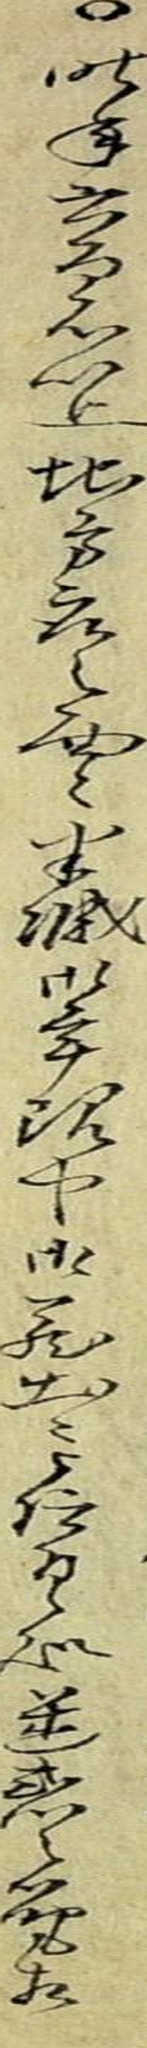○昨年六百石以上地方取之面々半減御年限中御蔵出に被仰付候処迷惑之筋も相
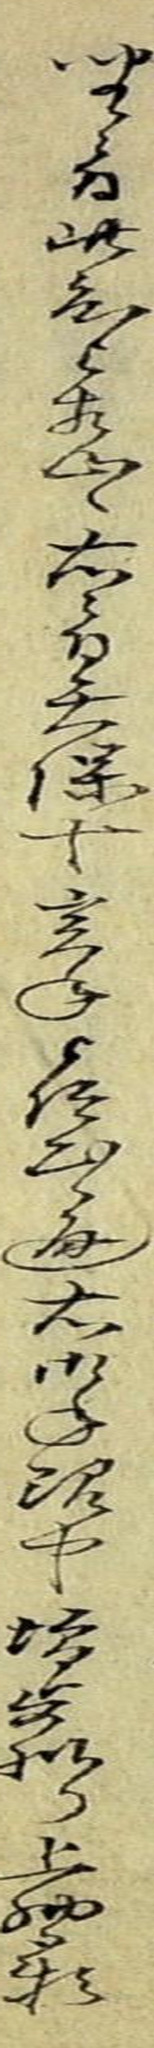聞候に付此度被相止候右に付天保十亥年被仰出候通右御年限中増歩掛り上納御頼
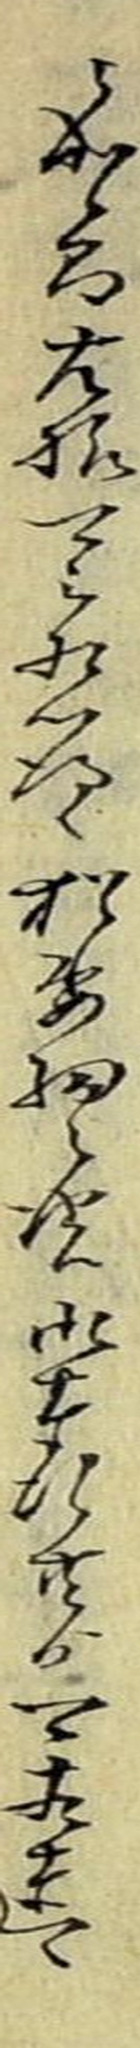被成候間左様可被相心得候猶委細之儀は御奉行共ゟ可相達候
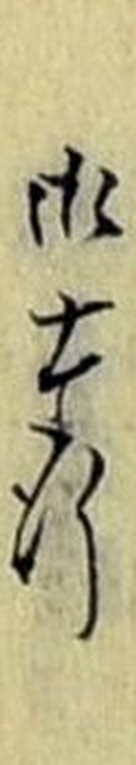御奉行
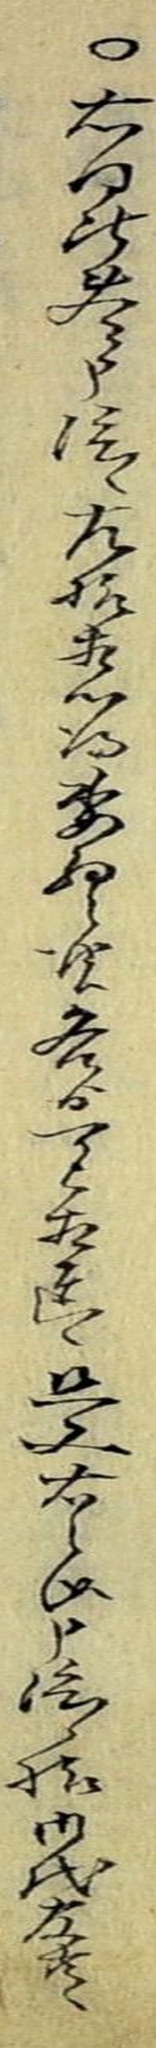○右同断夫々申渡候左様相心得委細之儀は各ゟ可相達候且又右之趣申渡候様御代官共へ
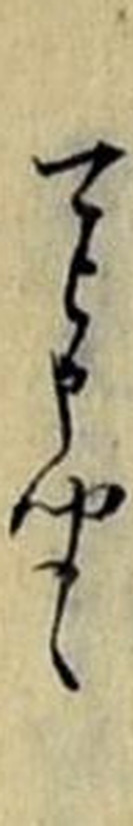可被申聞候
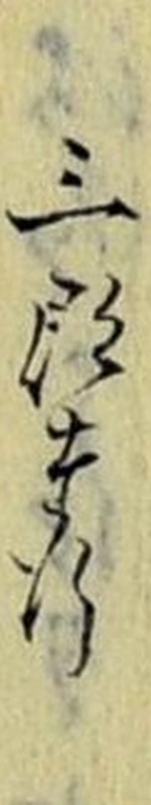三郡奉行
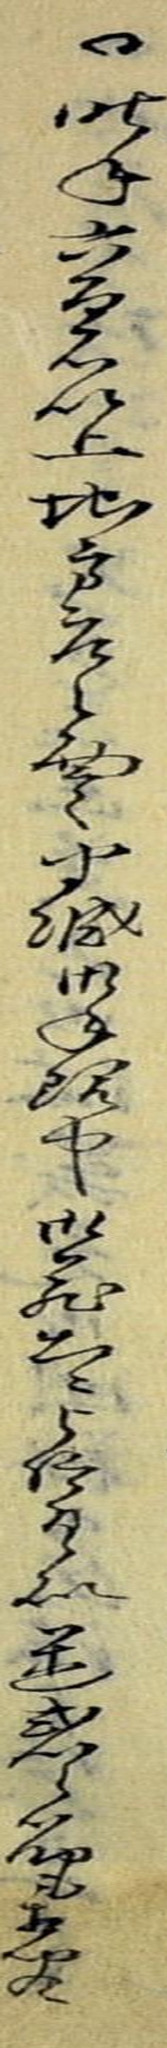○昨年六百石以上地方取之面々半減御年限中御蔵出に被仰付候処迷惑之筋も相聞候
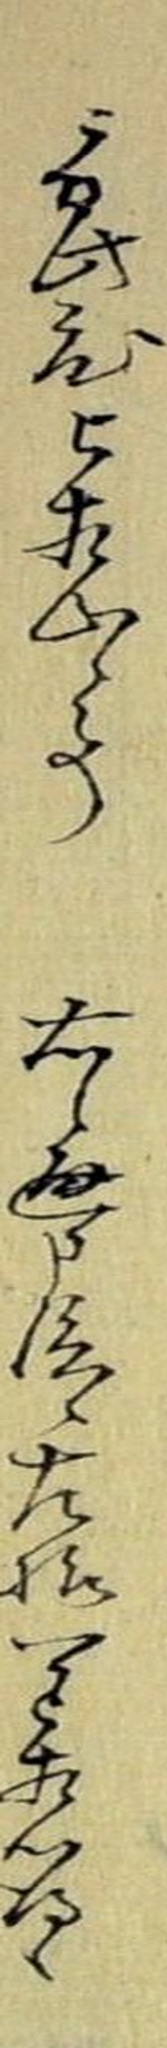に付此度被相止候事右之通申渡候左様可被相心得候
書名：命令之部 六
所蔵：福井県文書館 Fukui Prefectural Archives
